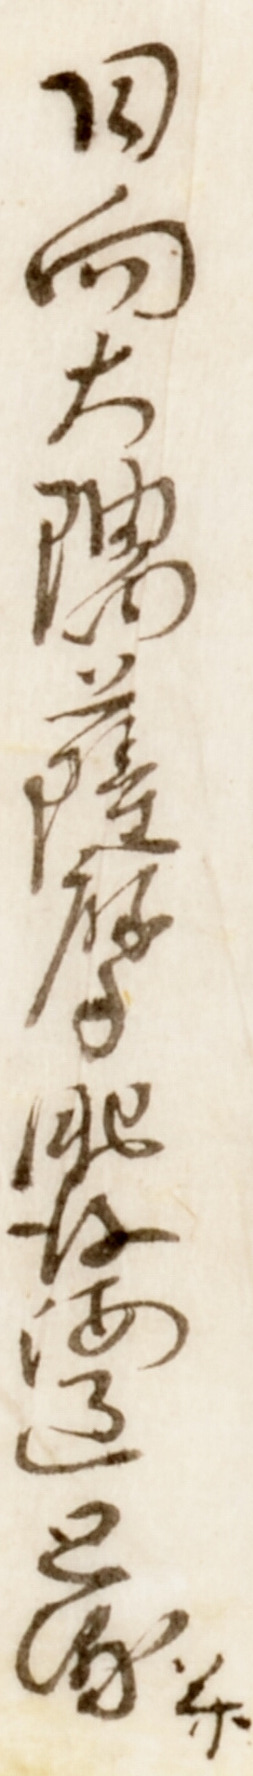日向大隅薩摩肥後海邊廻浦并
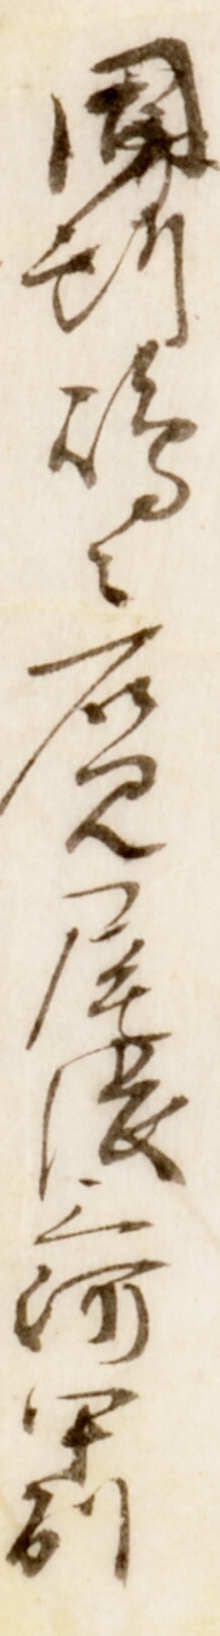同所嶋々石見尾張三河甲州
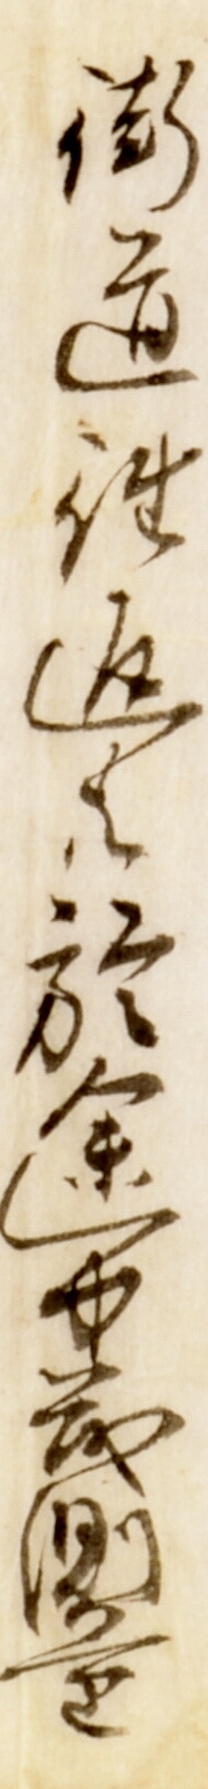街道往返共於途中茂測量
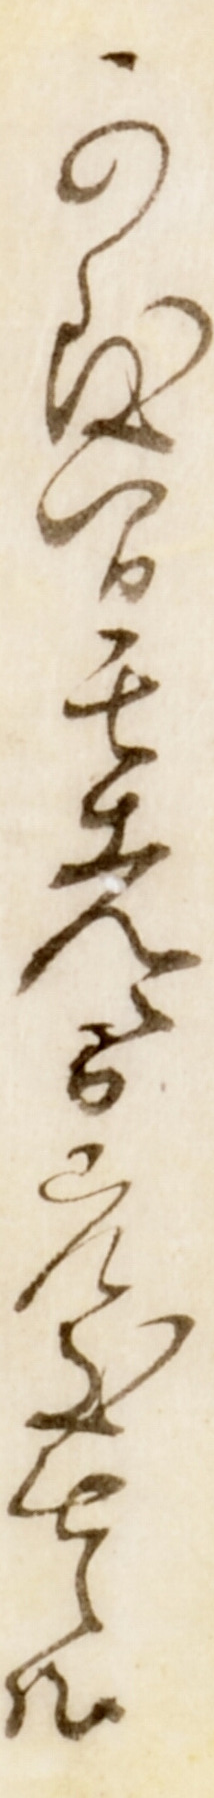可致間其先にて差支無之様
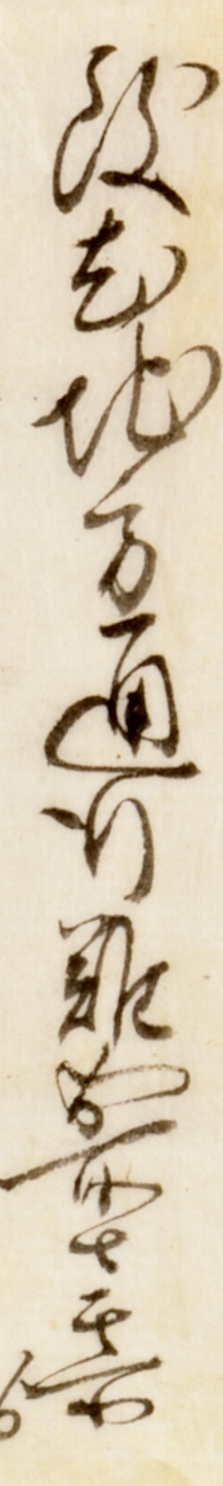致尤地方通行難成所者其所より
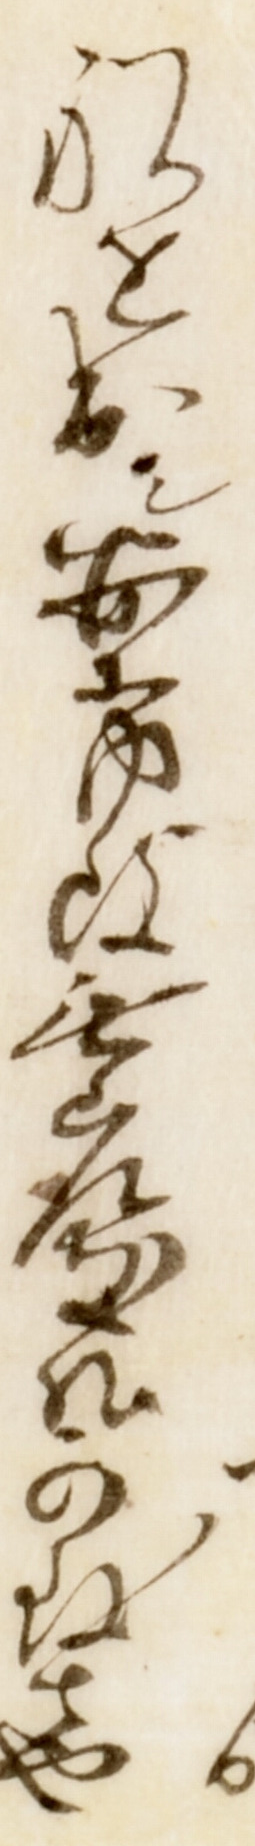船を出し案内致無差支様可致者也
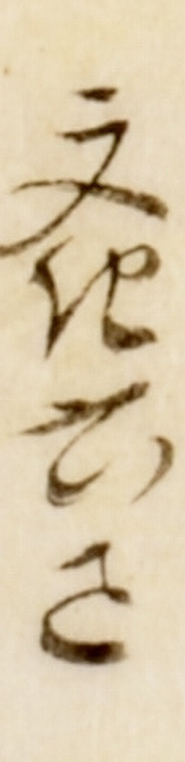文化六巳
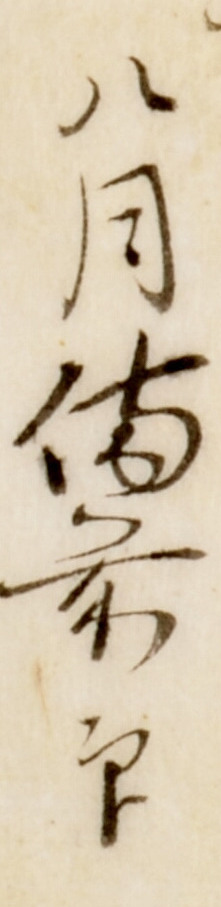八月備前印
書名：人馬先触（控）
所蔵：伊那市立高遠町図書館・合同会社AMANE
